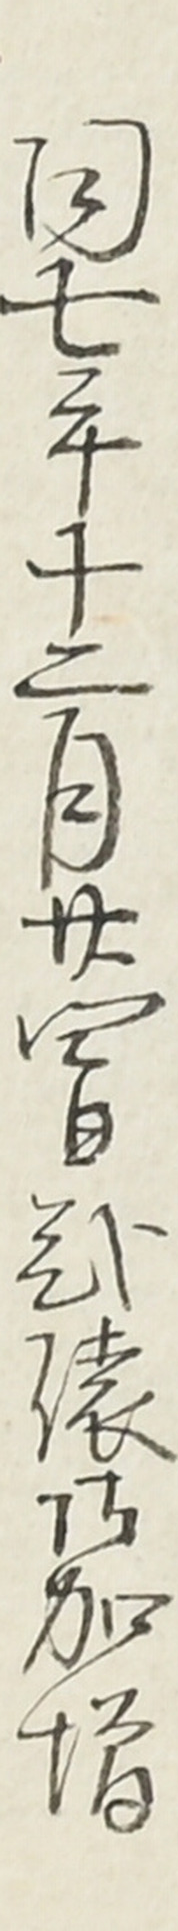一同七午十二月廿四日弐俵御加増
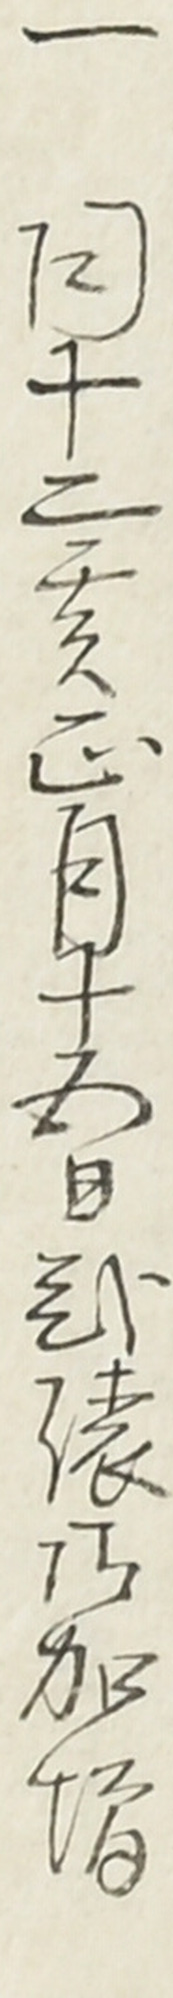一同十二亥正月十五日弐俵御加増
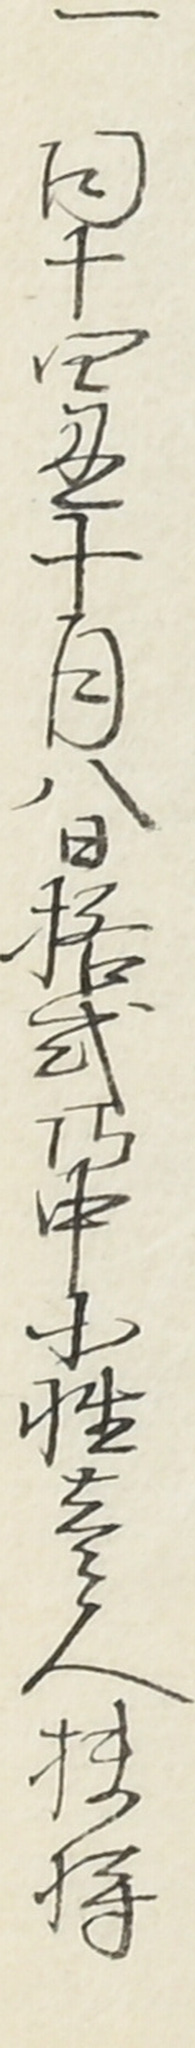一同十四丑十月八日格式御中小性壱人扶持

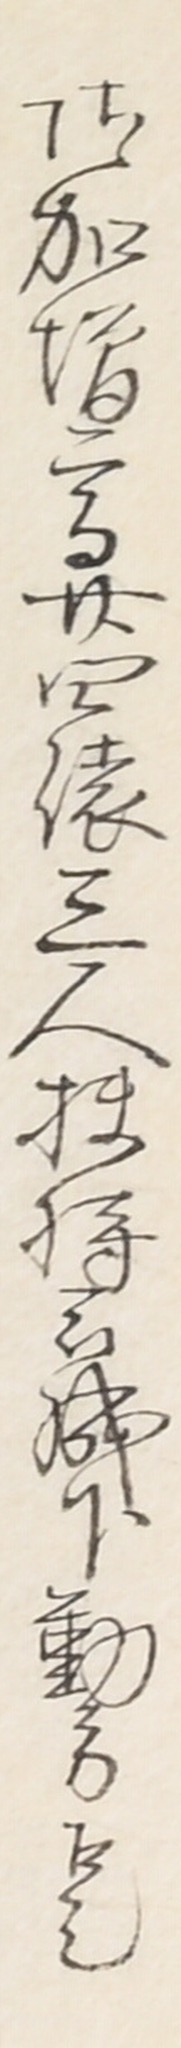御加増高廿四俵三人扶持被成下勤方是
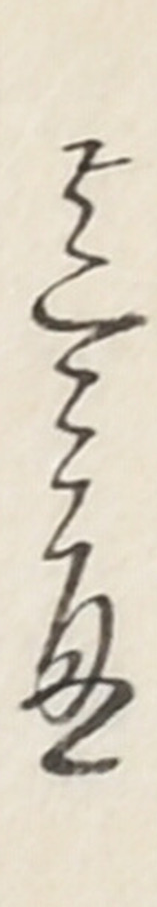迄之通
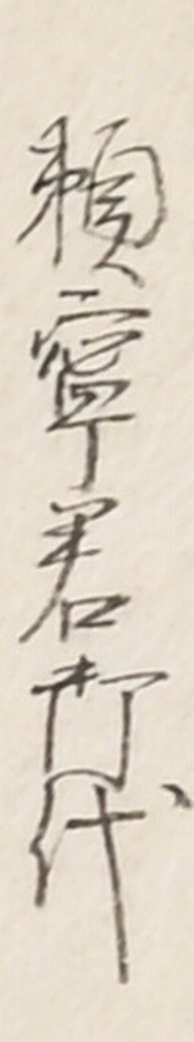頼寧君御代
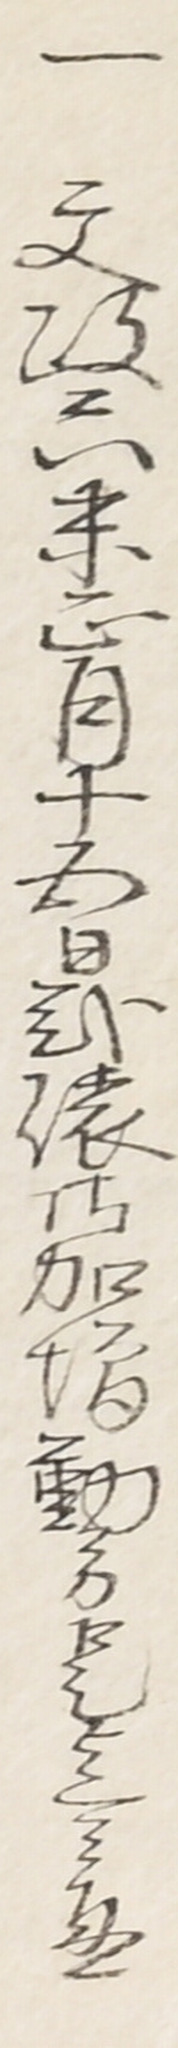一文政六未正月十五日弐俵御加増勤方是迄之通
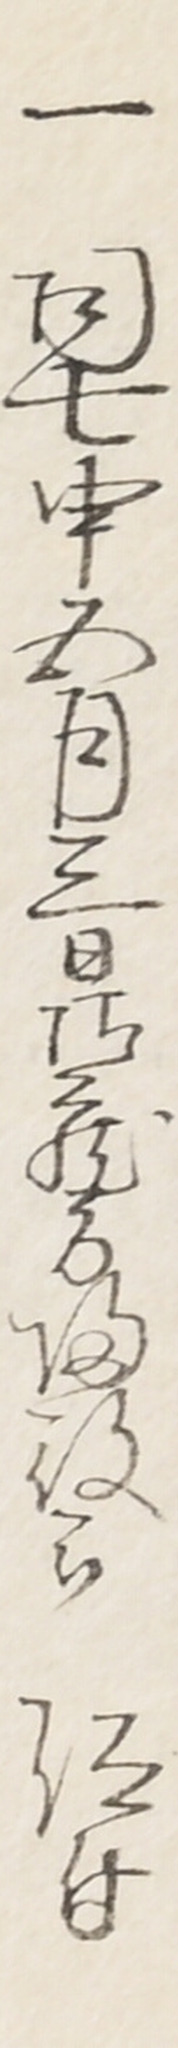一同七申五月三日御蔵方帰役被仰付
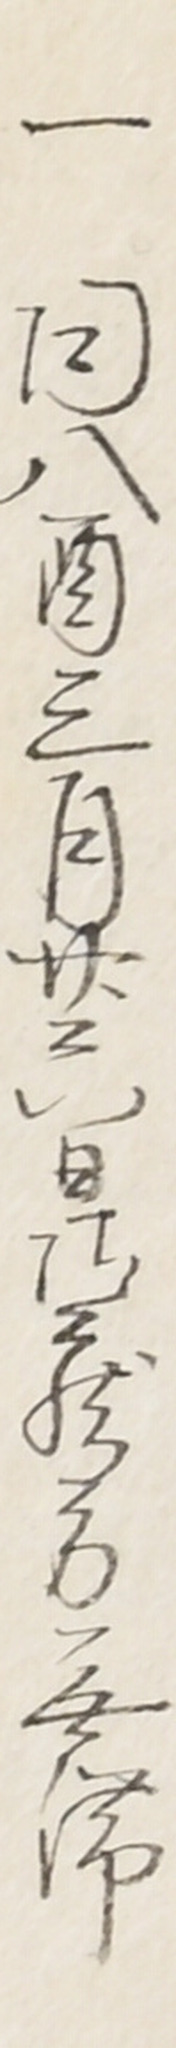一同八酉三月廿六日御蔵方無滞
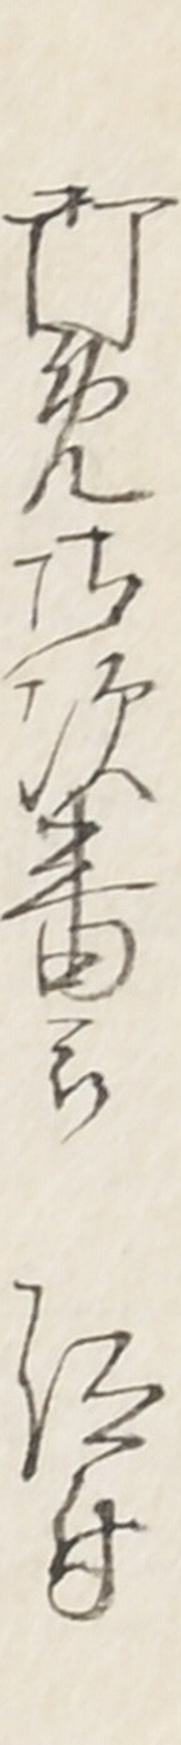御免御次番被仰付
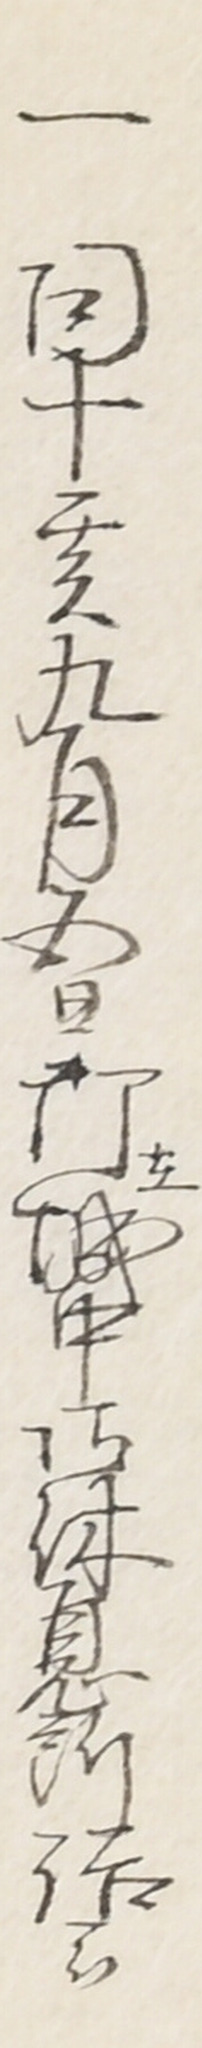一同十亥九月五日御城中御休息所詰被
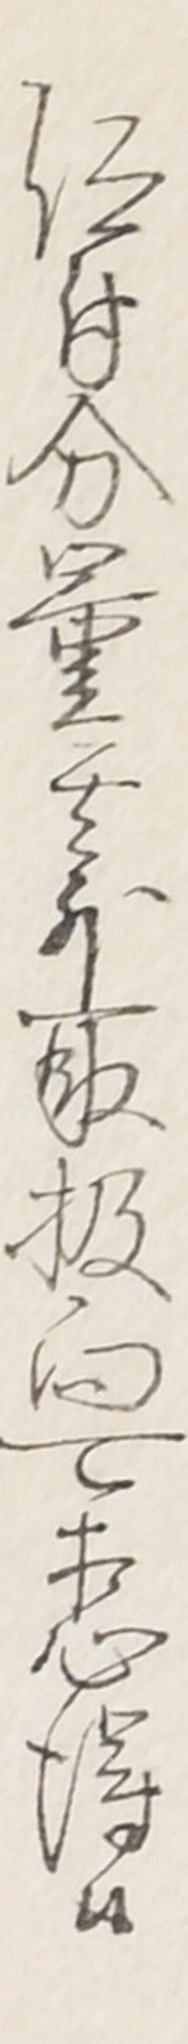仰付分量其外取扱向可相心得候
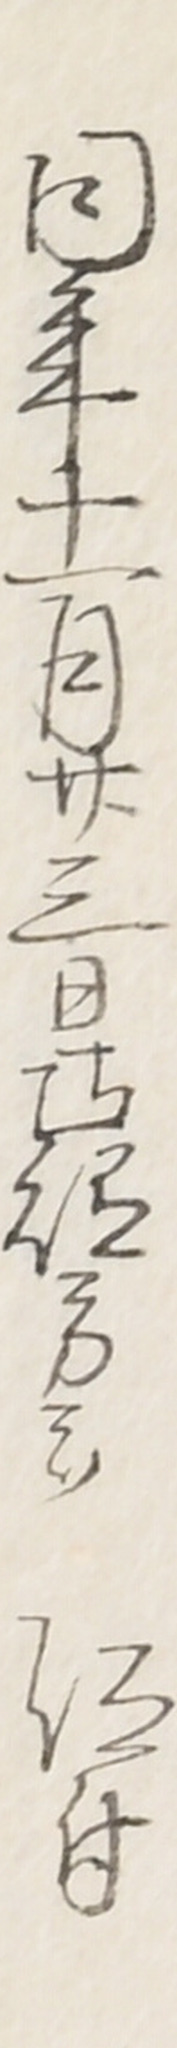一同年十一月廿三日御賄方被仰付
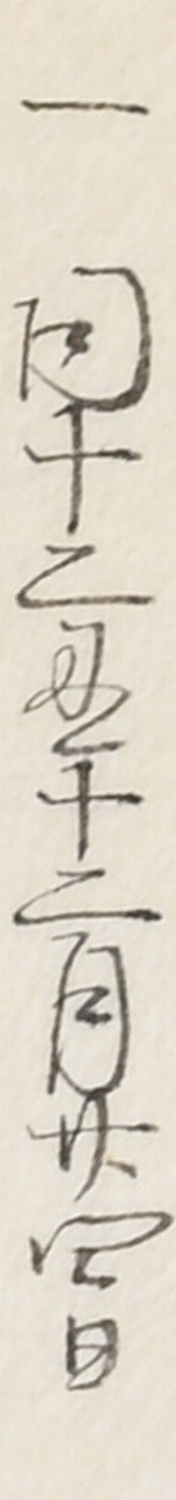一同十二丑十二月廿四日
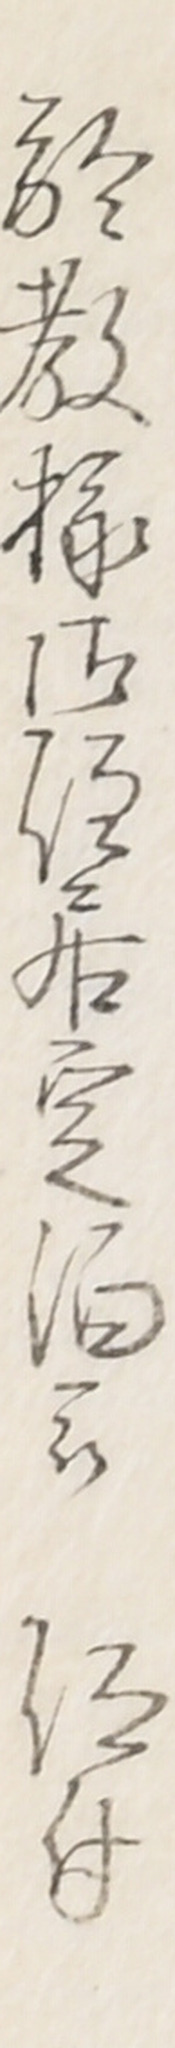於教様御住居定泊被仰付
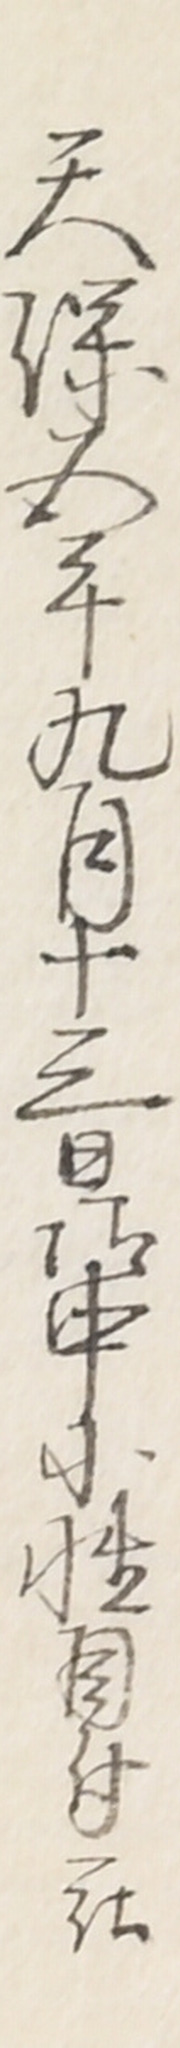一天保五午九月十三日御中小性目付被
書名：無足諸士勤仕録（四）
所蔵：伊那市立高遠町図書館・合同会社AMANE
